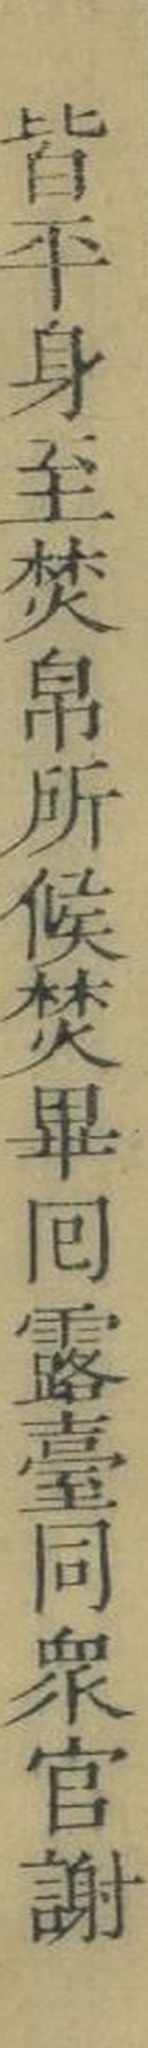皆平身至焚帛所候焚畢囘露臺同衆官謝
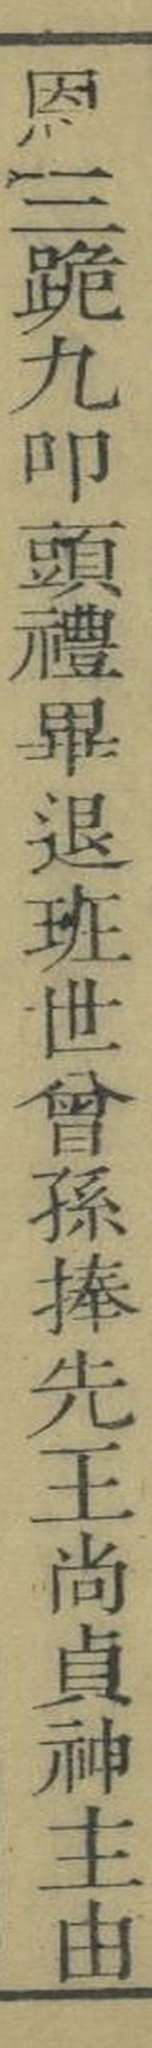恩三跪九叩頭禮畢退班世曾孫捧先王尚貞神主由
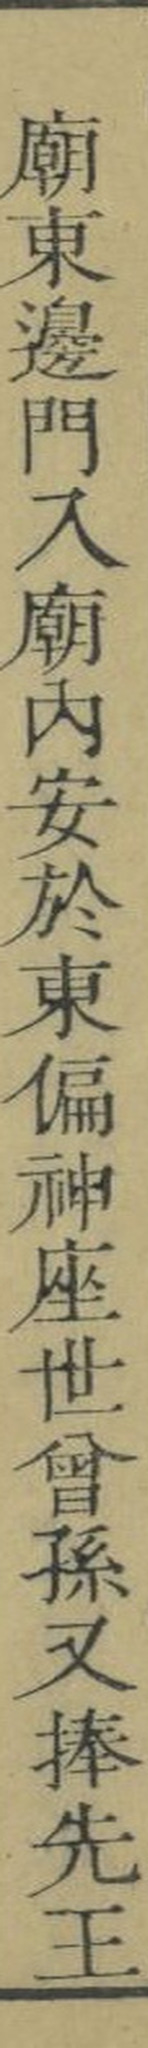廟東邊門入廟内安於東偏神座世曾孫又捧先王
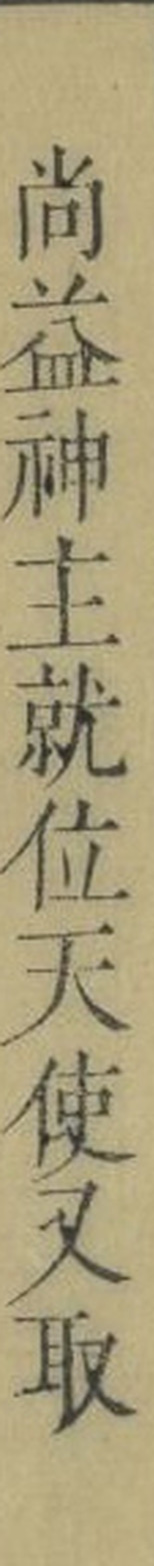尚益神主就位天使又取
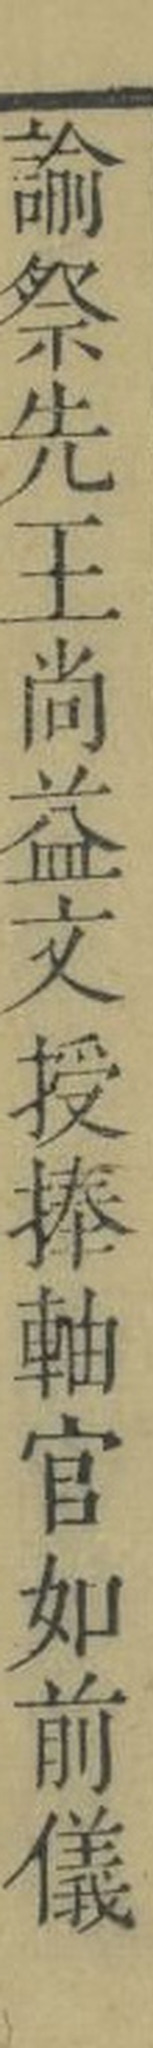諭祭先王尚益文授捧軸官如前儀
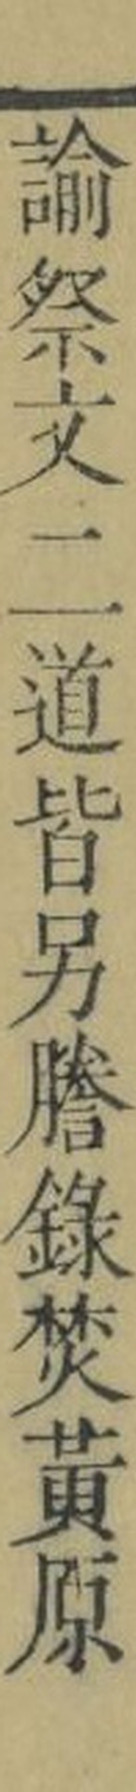諭祭文二道皆另謄錄焚黃原
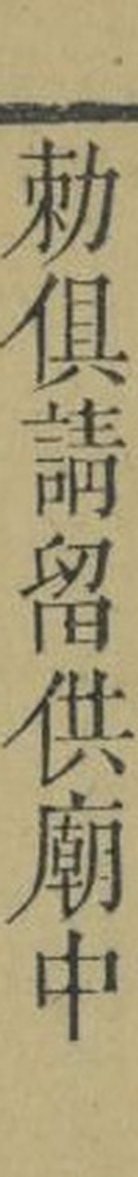勅俱請留供廟中
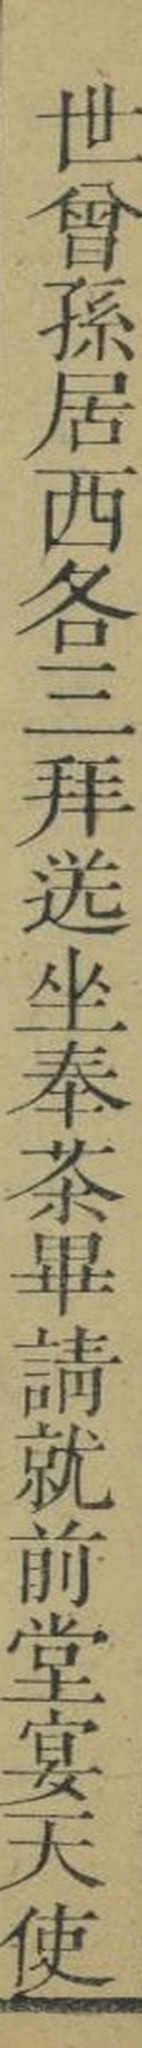世曾孫居西各三拜送坐奉茶畢請就前堂宴天使
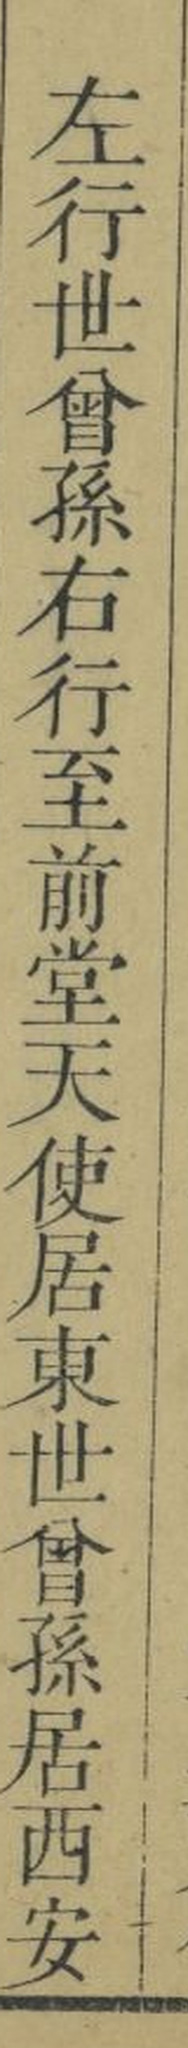左行世曾孫右行至前堂天使居東世曾孫居西安
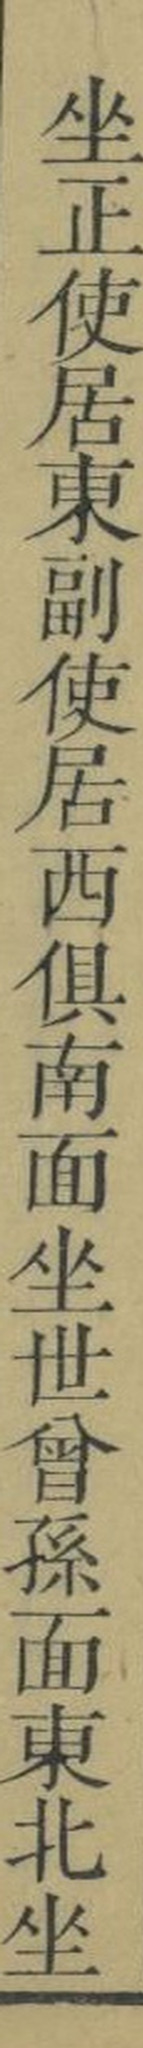坐正使居東副使居西俱南面坐世曾孫面東北坐
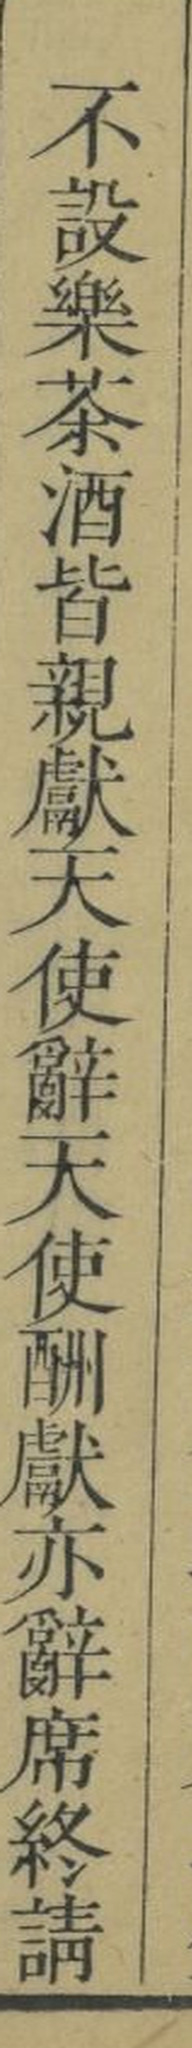不設樂茶酒皆親獻天使辭天使酬獻亦辭席終請
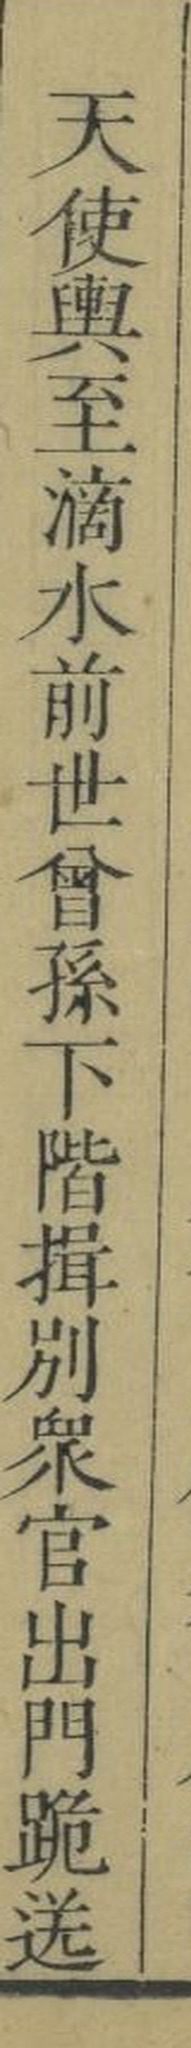天使輿至滴水前世曾孫下階揖別衆官出門跪送
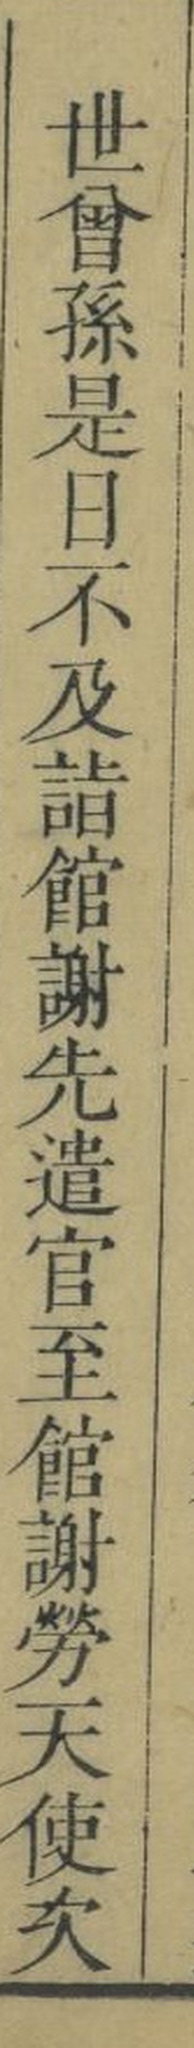世曾孫是日不及詣館謝先遣官至館謝勞天使次
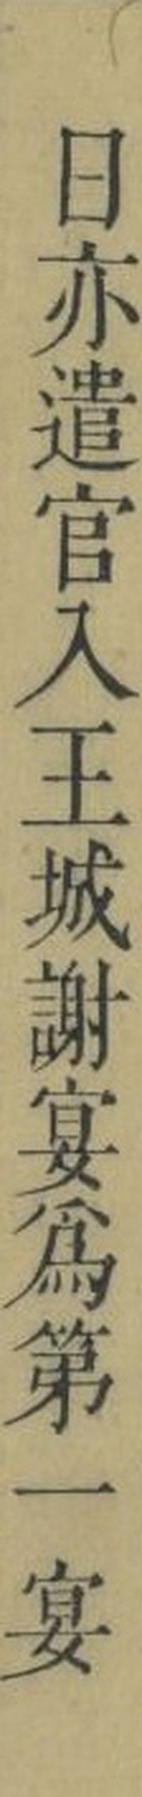日亦遣官入王城謝宴爲第一宴

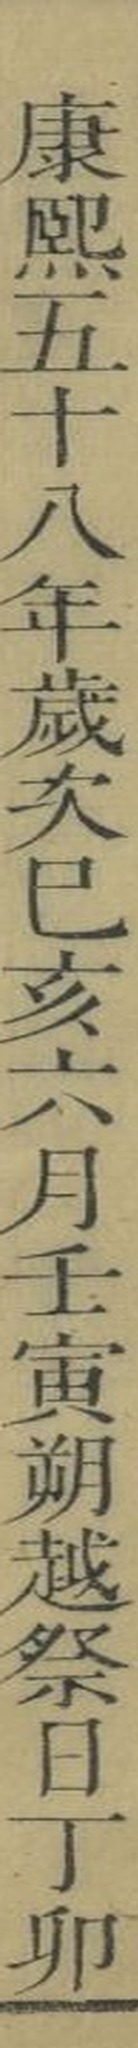康煕五十八年歲次巳亥六月壬寅朔越祭日丁卯
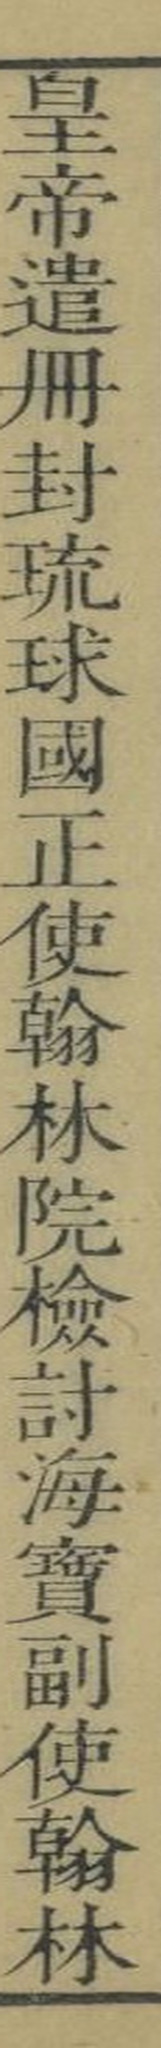皇帝遣冊封琉球國正使翰林院檢討海寶副使翰林
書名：中山伝信録 巻二
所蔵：University of the Ryukyus Library
